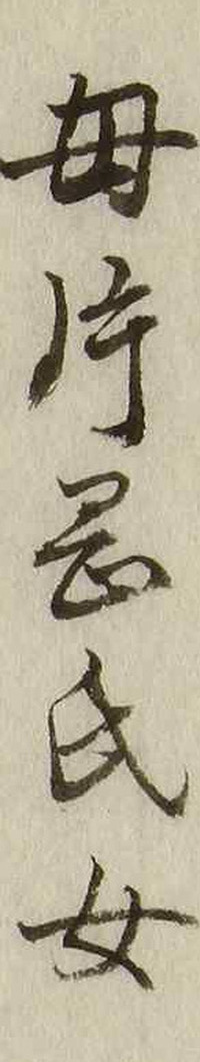母片岡氏女
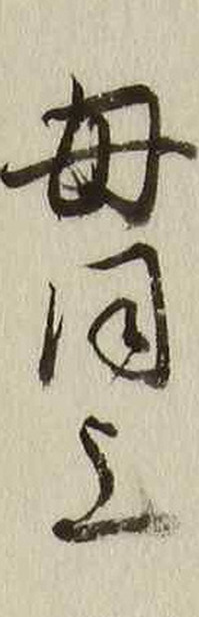母同上
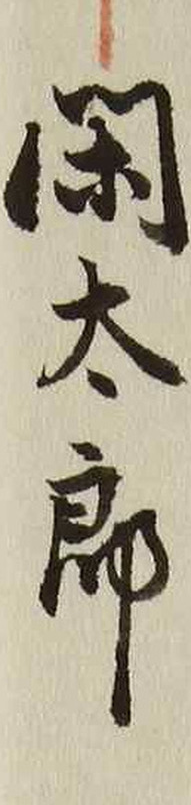閑太郎
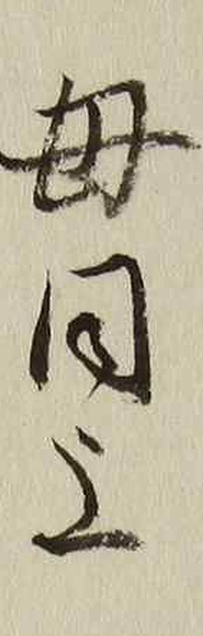母同上
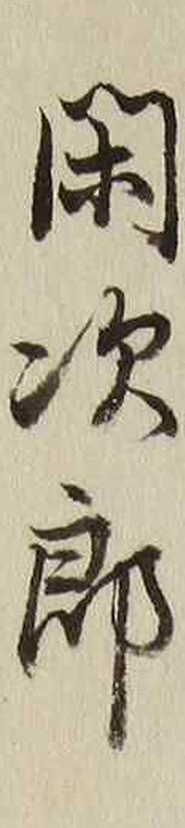閑次郎
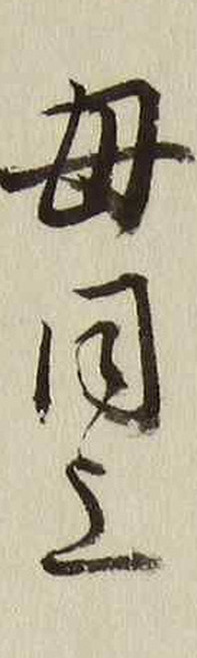母同上

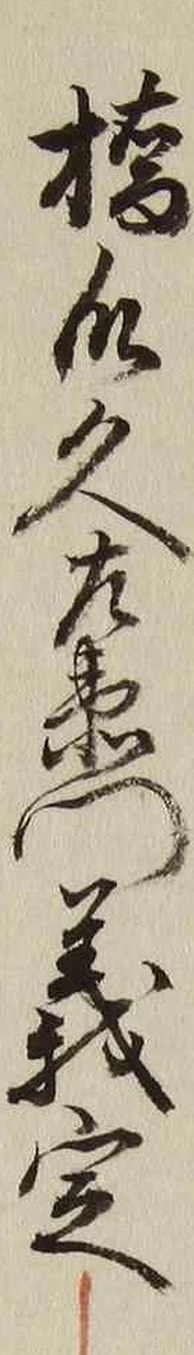橋爪久左衛門義定
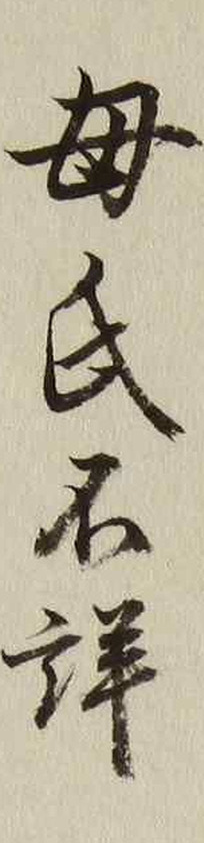母氏不詳
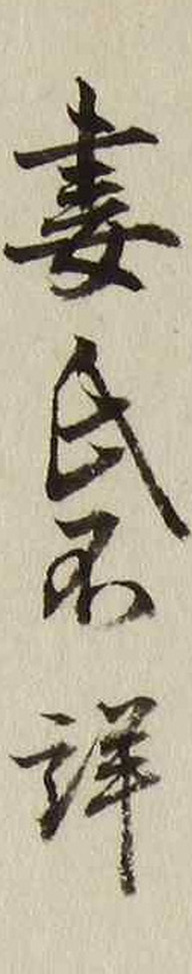妻氏不詳
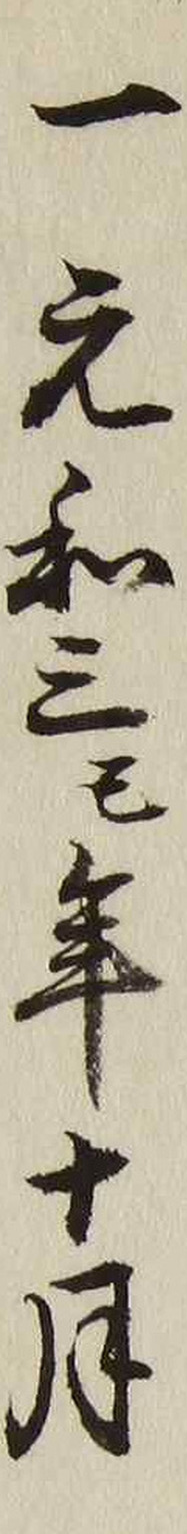一元和三巳年十月
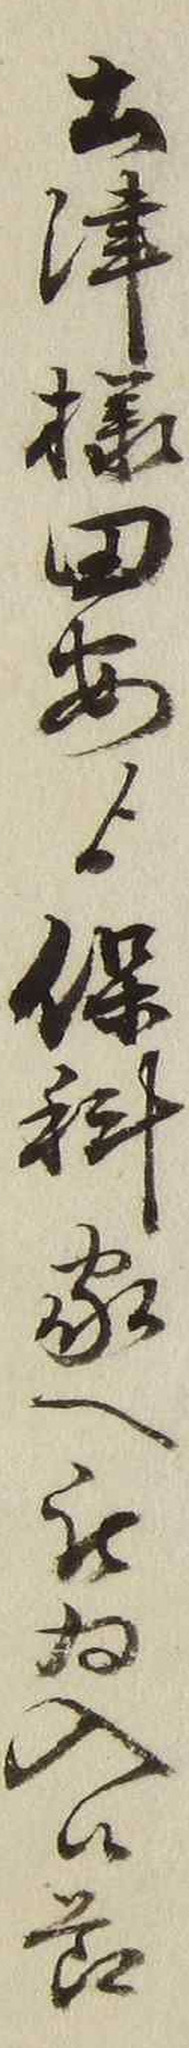土津様田安ゟ保科家へ被為入候節

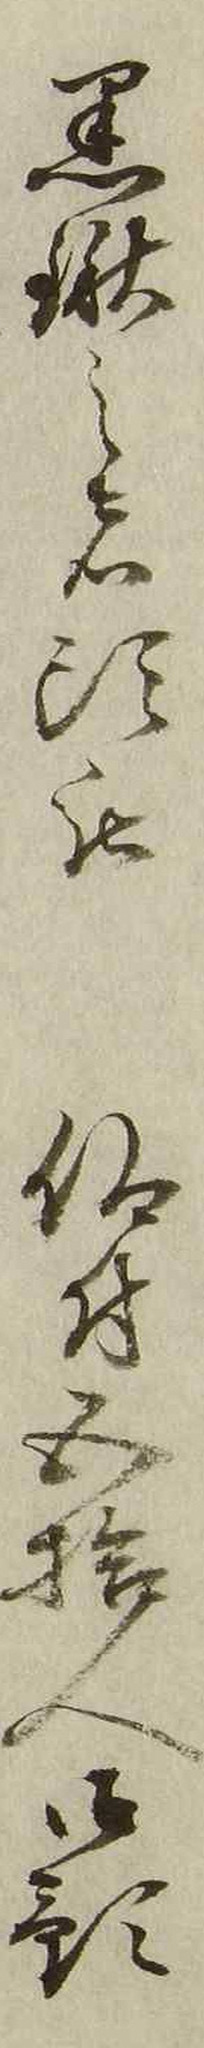黒鍬之者頭被仰付五拾人御預
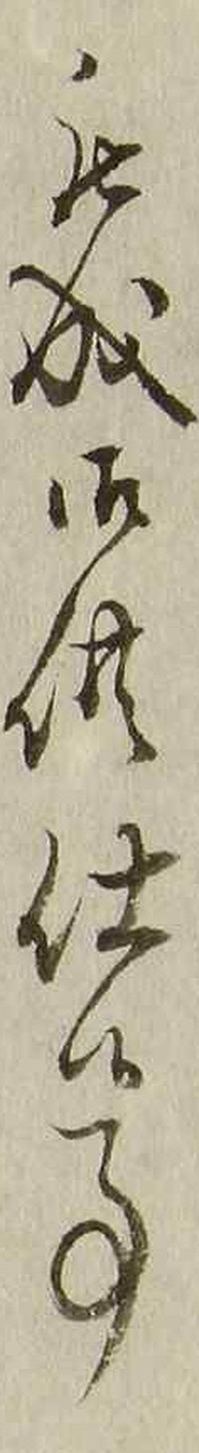被成御供仕候事
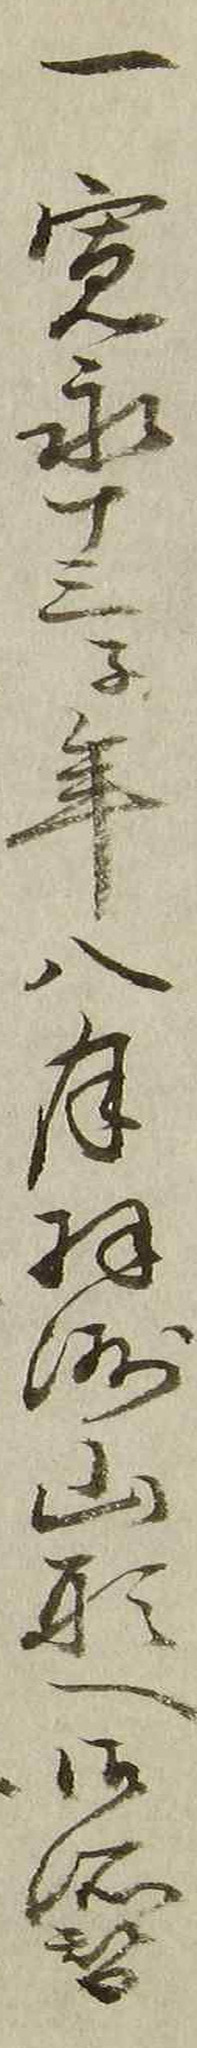一寛永十三子年八月羽州山形へ御所替
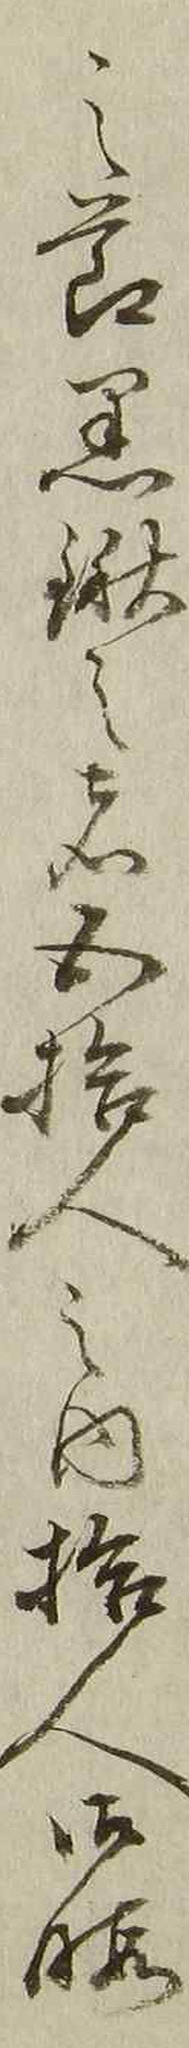之節黒鍬之者五拾人之内拾人御暇
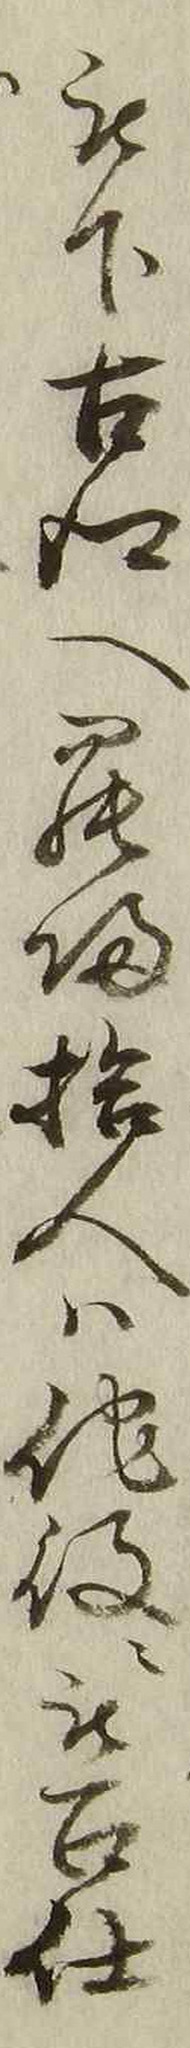被下古郷へ罷帰拾人ハ他役ニ被召仕
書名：諸士系譜　巻之39　は之部7
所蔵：会津若松市立会津図書館
